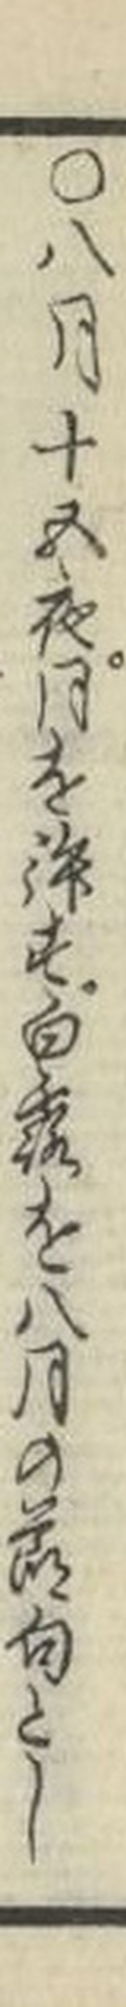○八月十五夜。月を拝す。白露を八月の節句とし
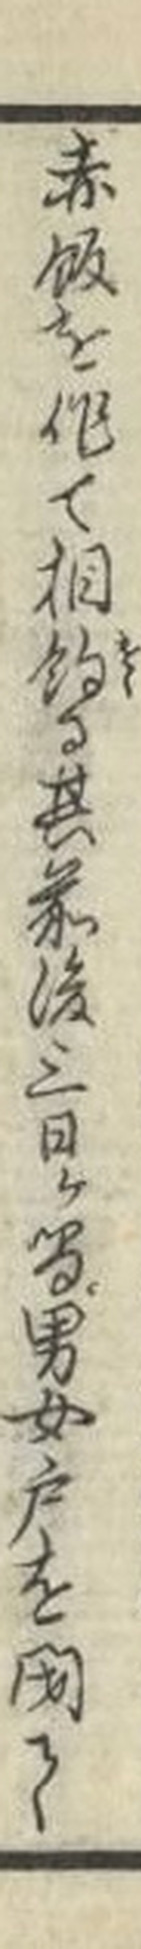赤飯を作て相餉る其前後三日ヶ間。男女戸を閉て
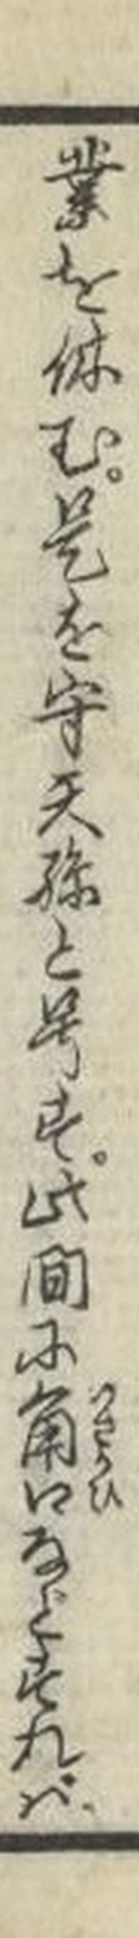業を休む。是を守天孫と号す。此間に角口などすれば
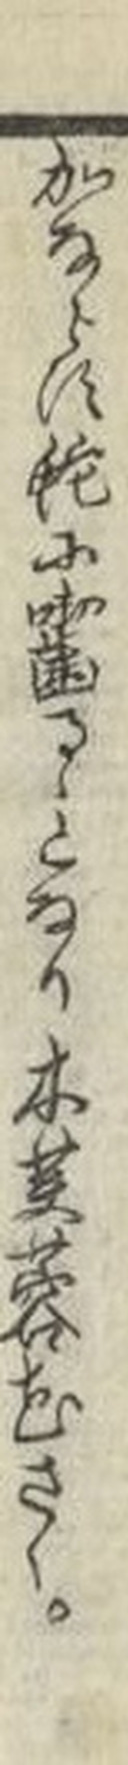かならす蛇に囓るゝとなり木芙蓉花さく。
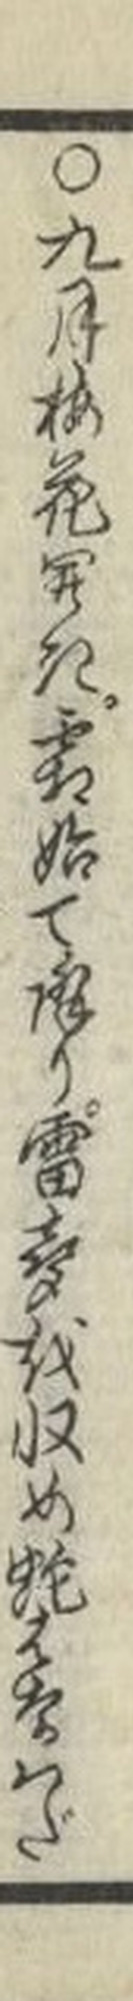○九月梅花開き。霜始て降り。雷声を収め蛇はなはだ
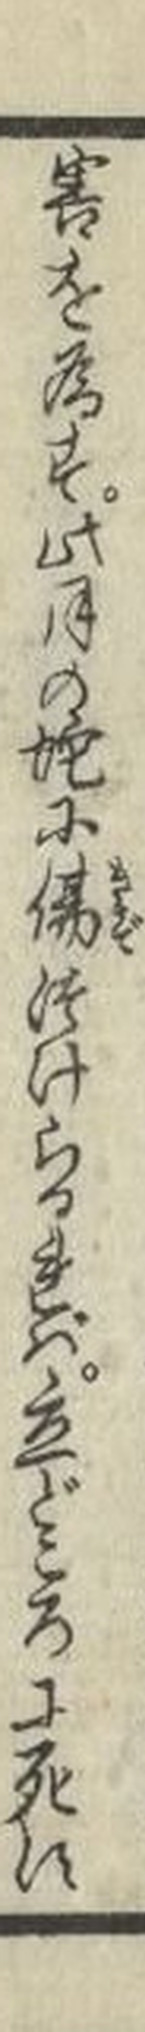害を為す。此月の蛇に傷つけらるれば。立どころに死す
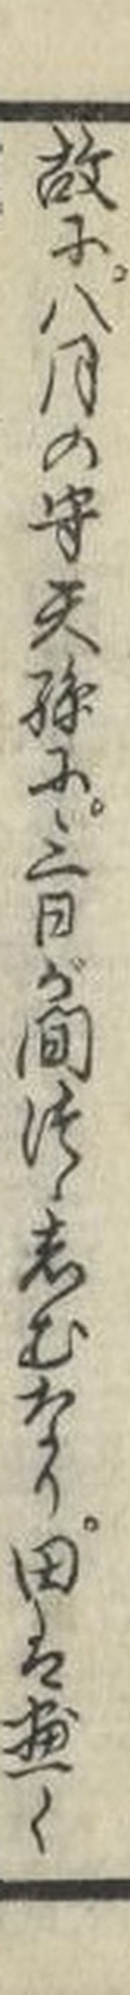故に。八月の守天孫に。三日が間つゝしむなり。田は尽く

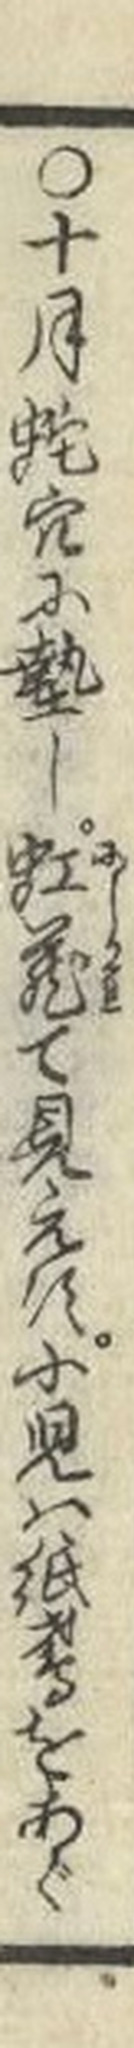○十月蛇穴に墊し。虹蔵て見えす。小児は紙鳶をあぐ
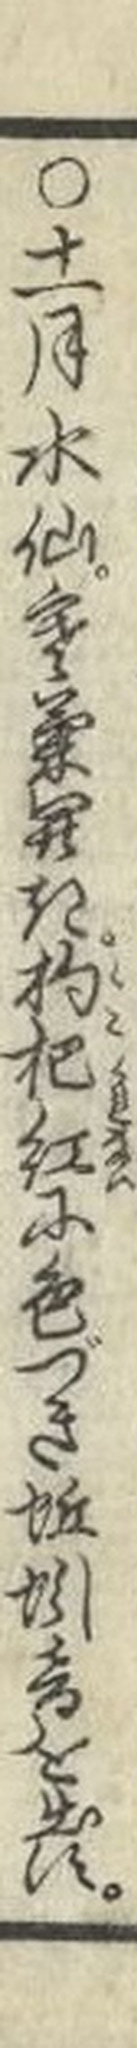○十一月水仙。寒菊開き。枸杷紅に色づき蚯蚓音を出す。
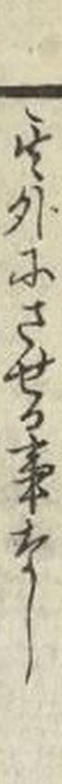其外にさせる事なし
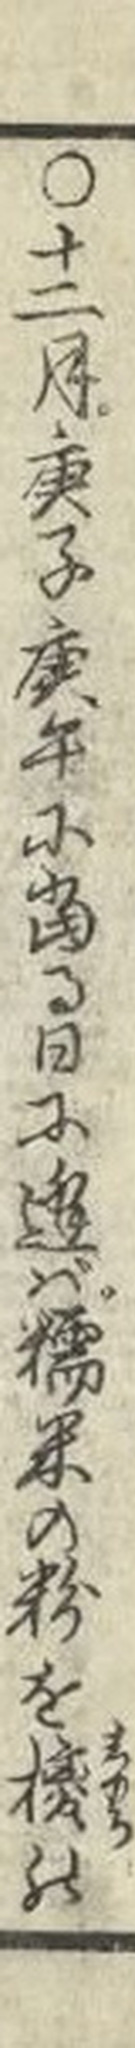○十二月。庚子庚午に当る日に逢ば。糯米の粉を椶の
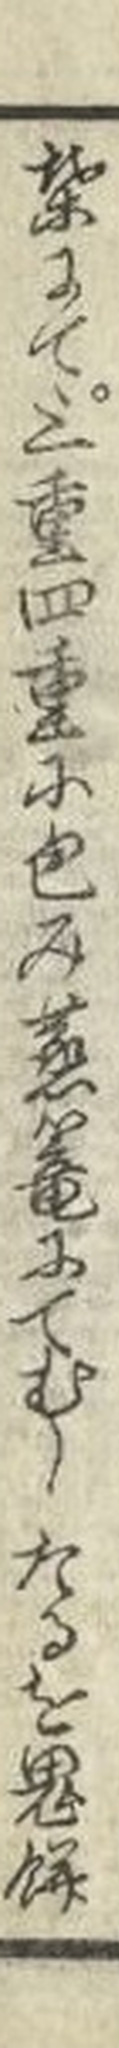葉にて。三重四重に包み蒸籠にてむしたるを鬼餅
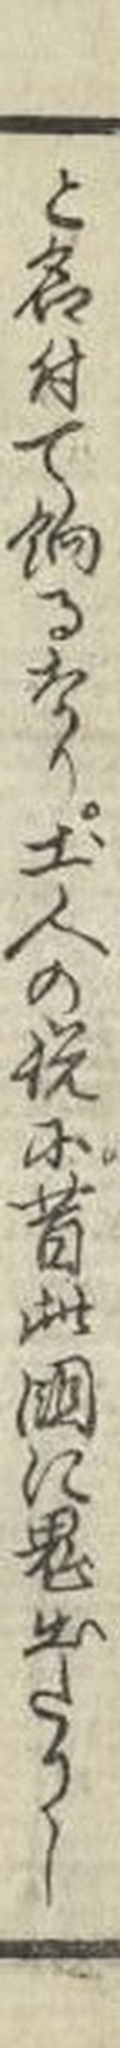と名付て餉るなり。土人の説に。昔此国に鬼出たりし
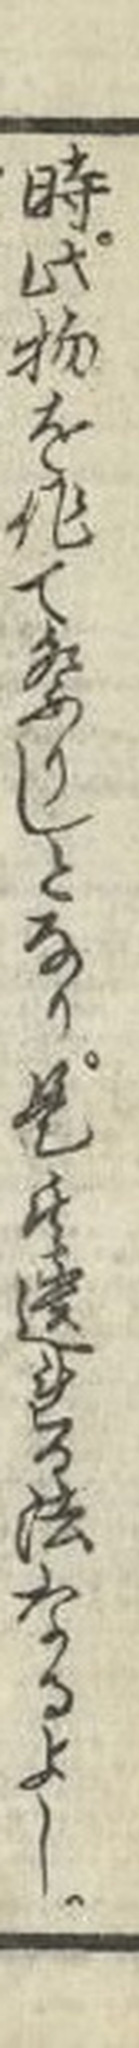時此物を作て祭りしとなり。是其遺れる法なるよし。
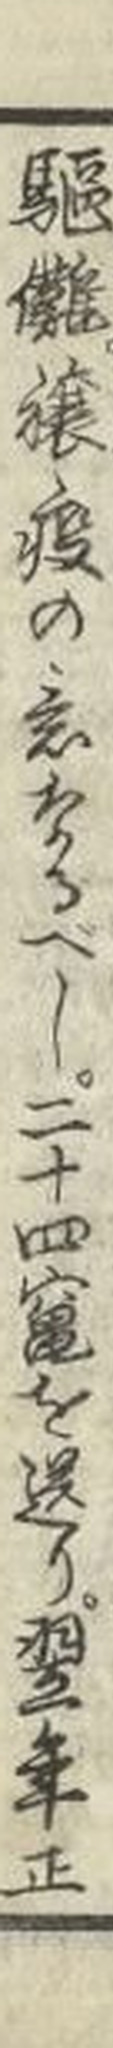驅儺。禳疫の意なるべし。二十四竃を送り。翌年正
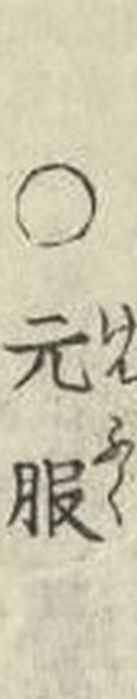○元服
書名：琉球解語
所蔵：University of the Ryukyus Library
